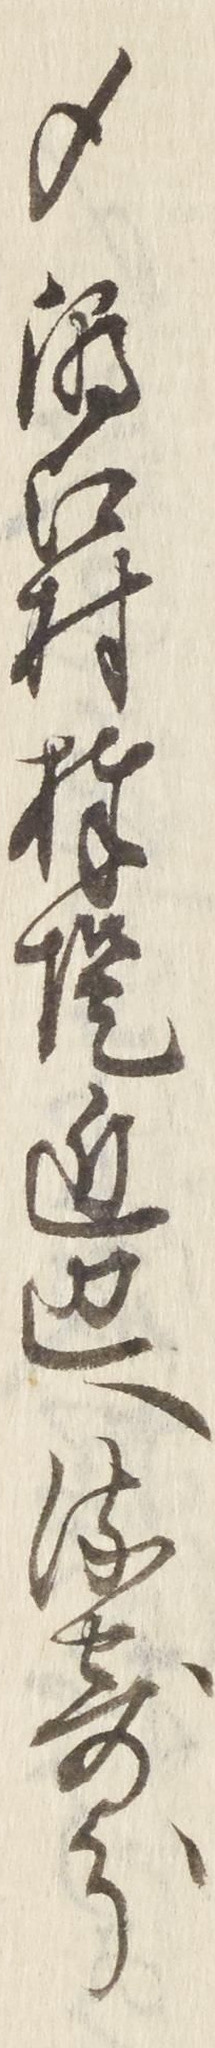〆潮江村棒堤近辺へ流寄分
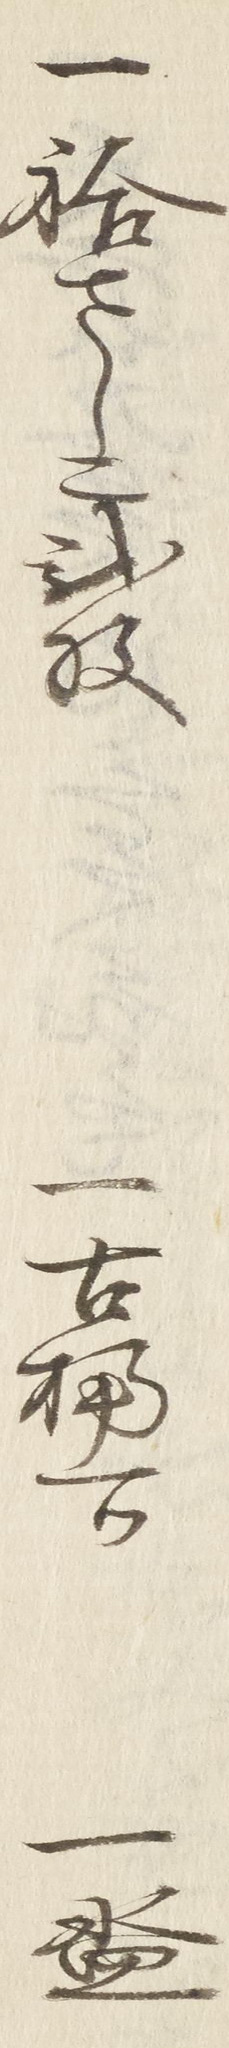一袷さしこ弐枚一古桶一ッ一泴一ッ
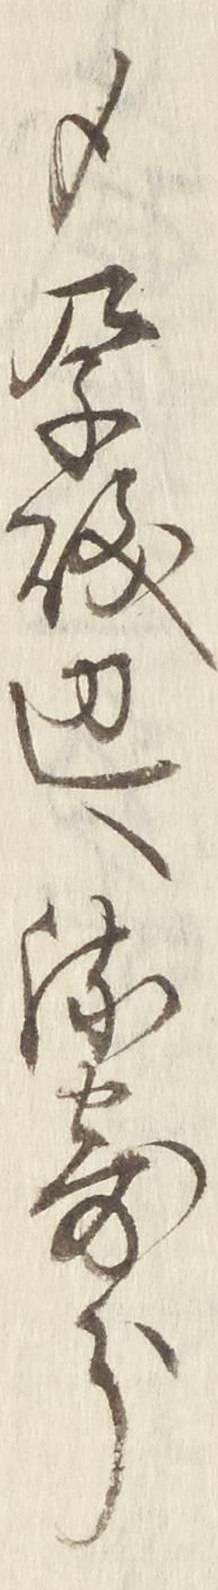〆孕磯辺へ流寄分
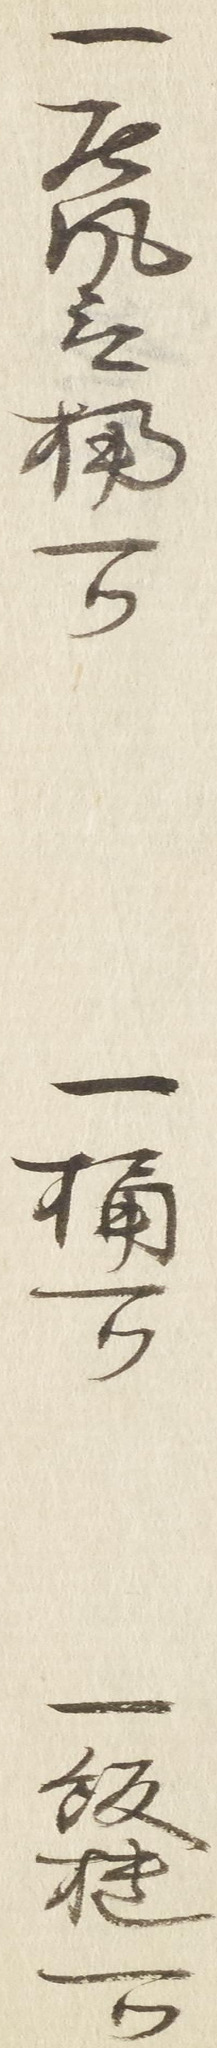一居風呂桶一ッ一桶一ッ一飯櫃一ッ
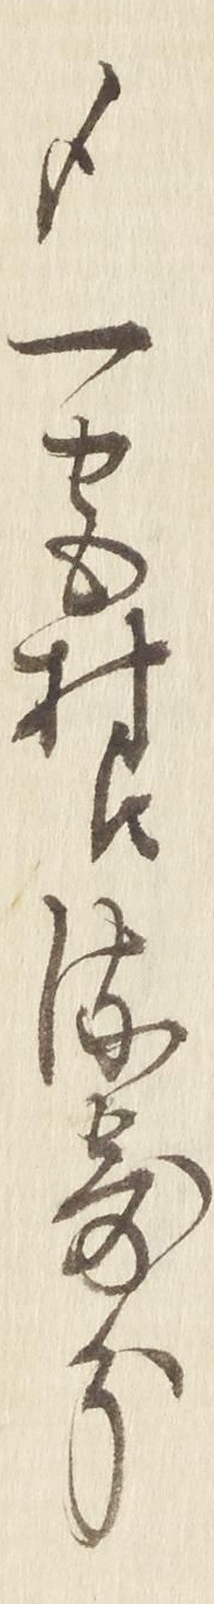〆一宮村江流寄分
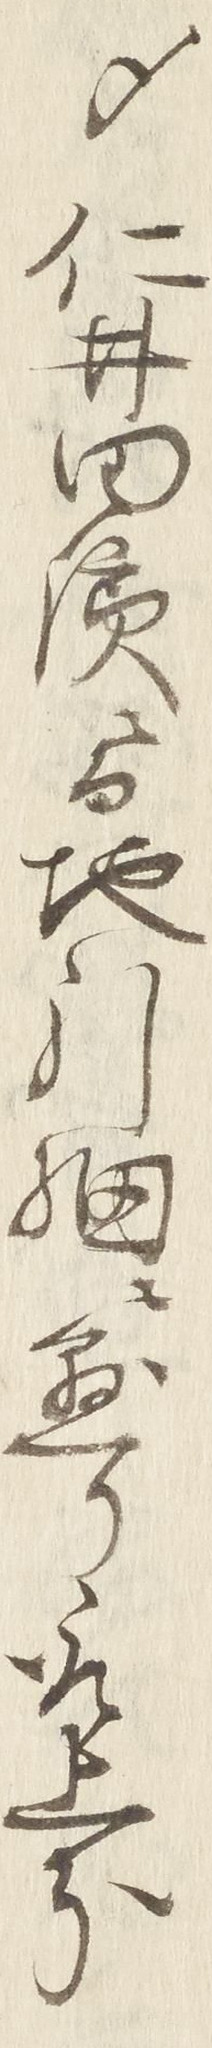〆仁井田浜二而地引網二懸り取上分
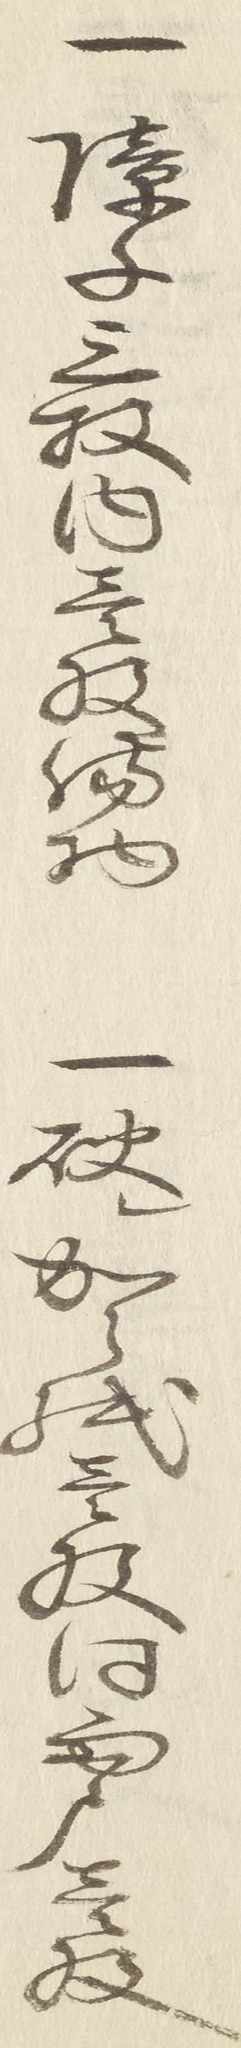一障子三枚内壱枚傷物一破ㇾから紙壱枚同雨戸壱枚
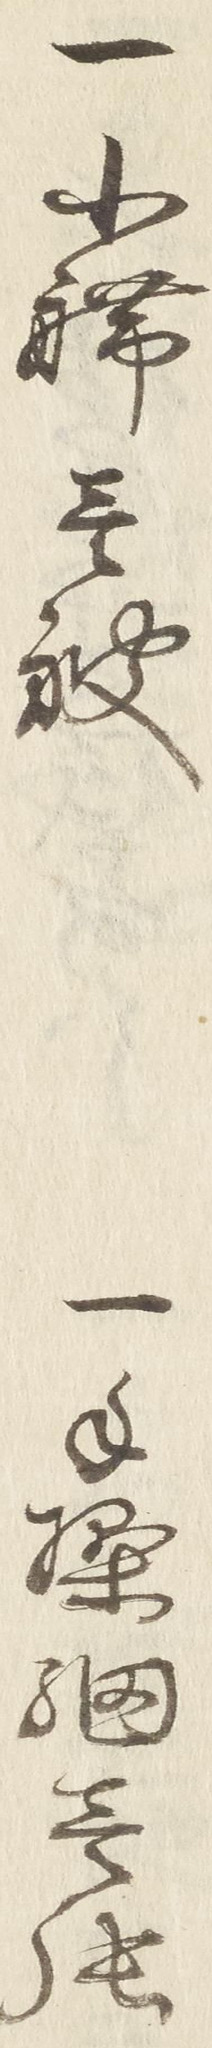一小艀壱艘一手繰網壱張
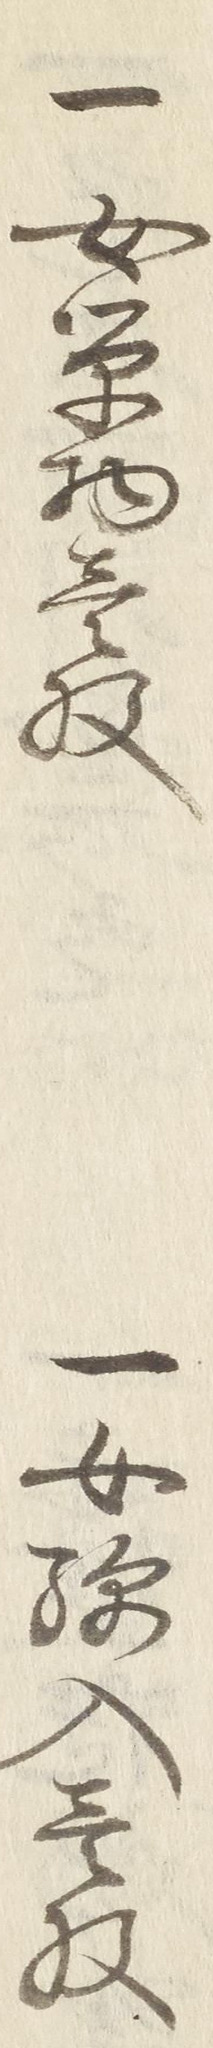一女単物壱枚一女綿入壱枚
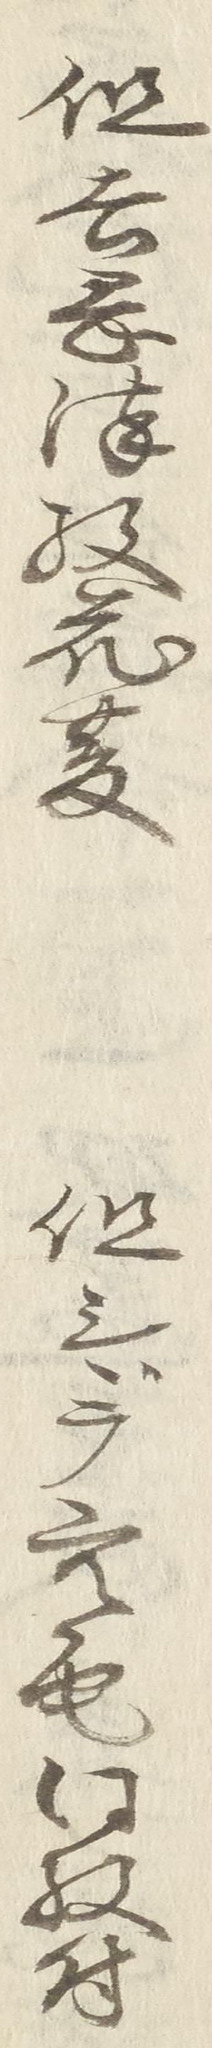但吉岡津紋花菱但シゞラ空色同紋付
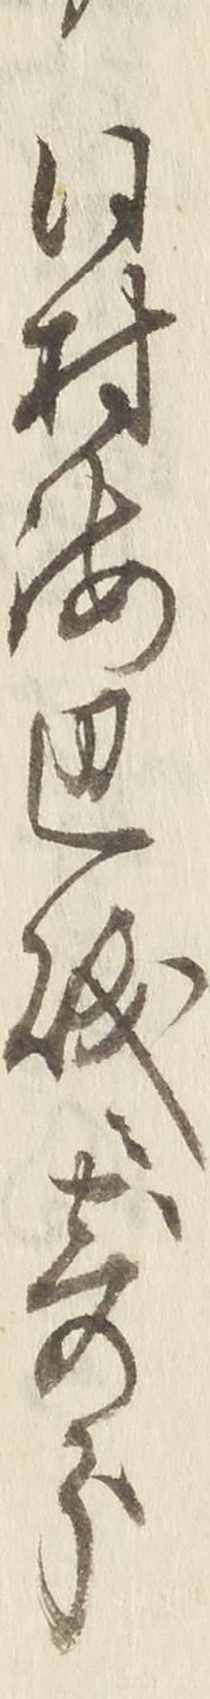〆同村海辺磯へ寄分
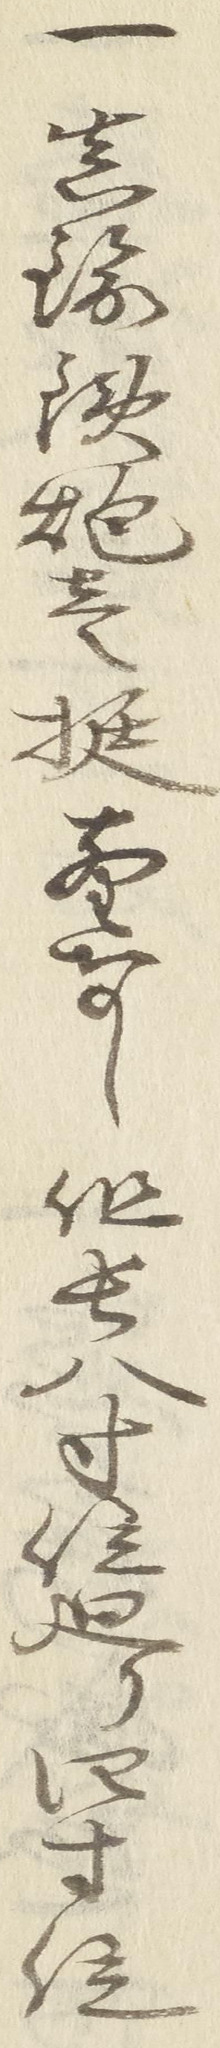一真鍮鉄炮壱挺台なし但し長八寸位廻り四寸位
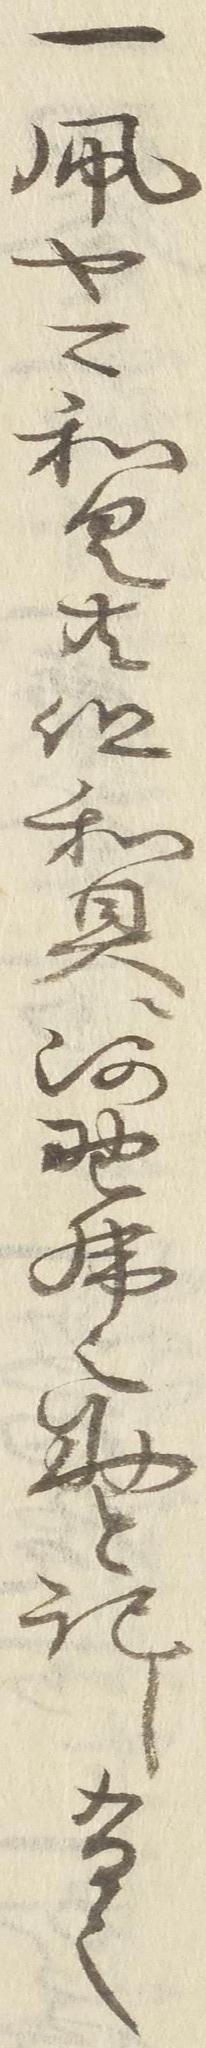一凧やて和具共但和具二河野虎之助と記し有之

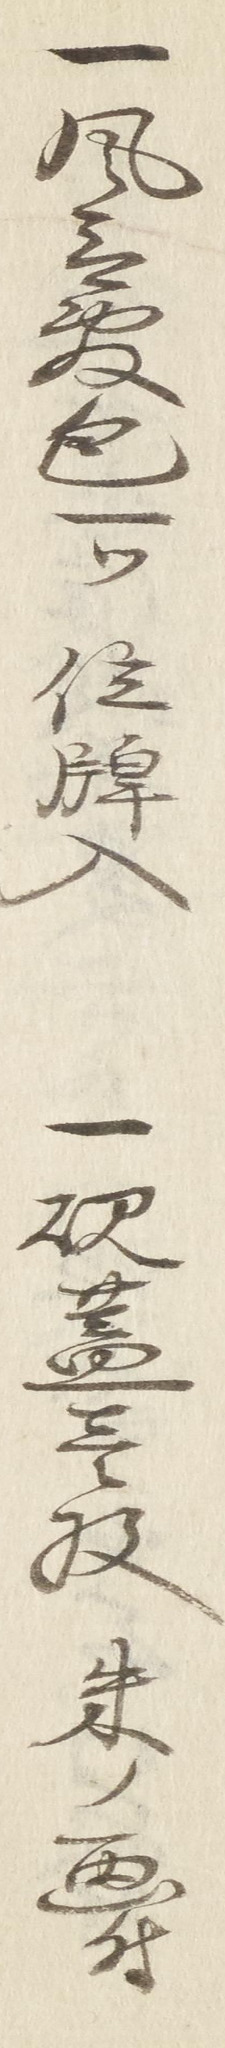一風呂敷包一ッ位牌入一硯蓋壱枚朱の画付
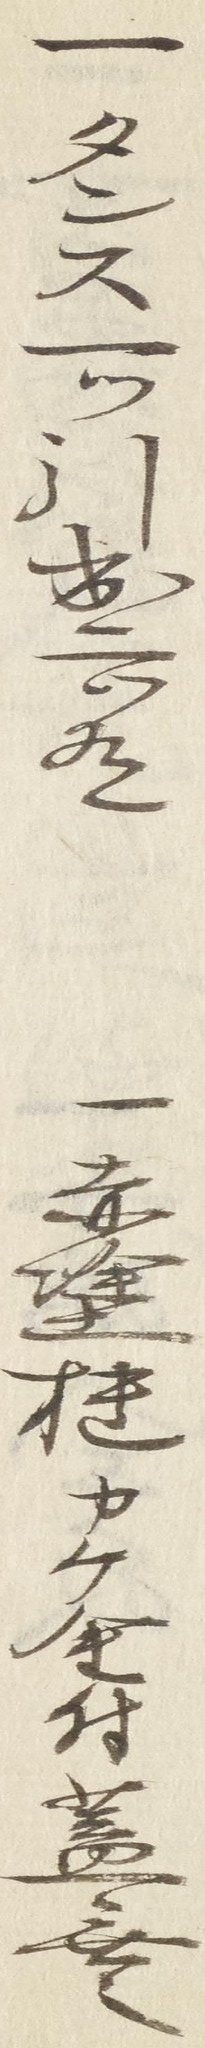一タンス一ッ引出二ッ有一赤塗柱カケ金付蓋無之
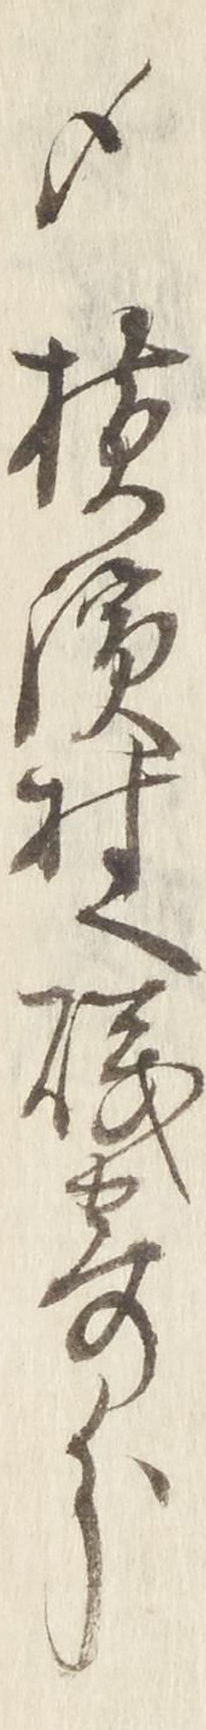〆横浜村磯寄分
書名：地震記　下
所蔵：東京大学地震研究所図書室 Earthquake Research Institute Library, The University of Tokyo, JAPAN
